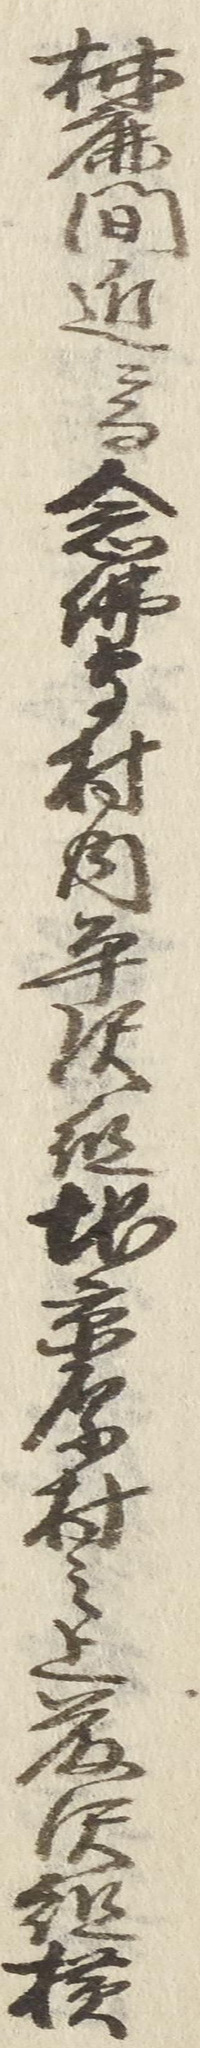麓間近二而念仏寺村之内平沢組地京原村之上藤沢組横
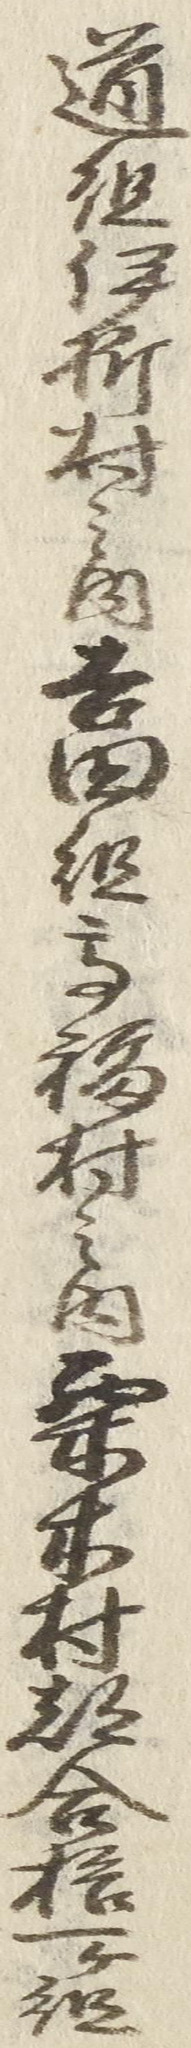道組伊折村之内太田組高福村之内栗木村都合拾一ヶ組
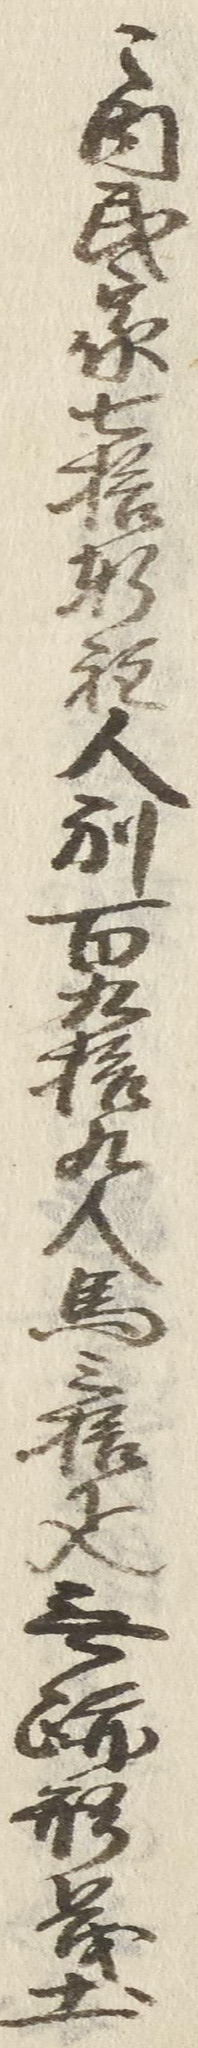之内民家七拾軒程人別百九拾九人馬三拾疋無跡形も土
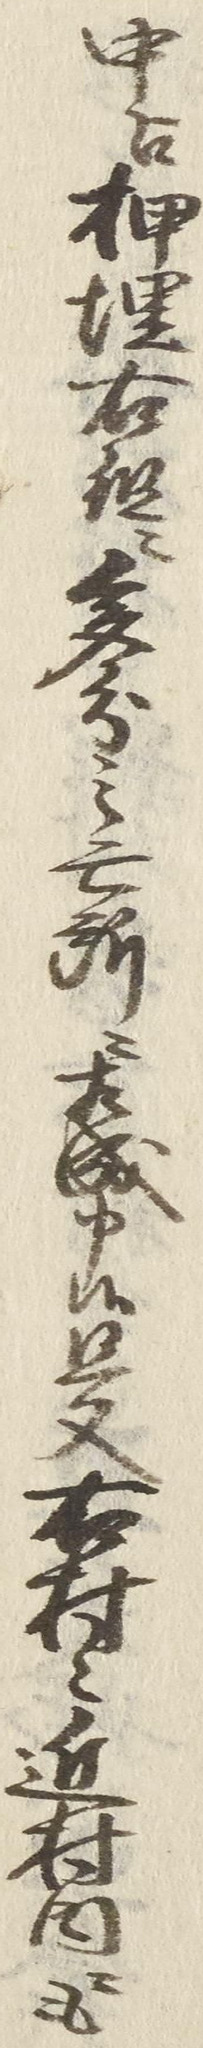中江押埋右組二多分之亡所二相成申候且又右村々近村之内二
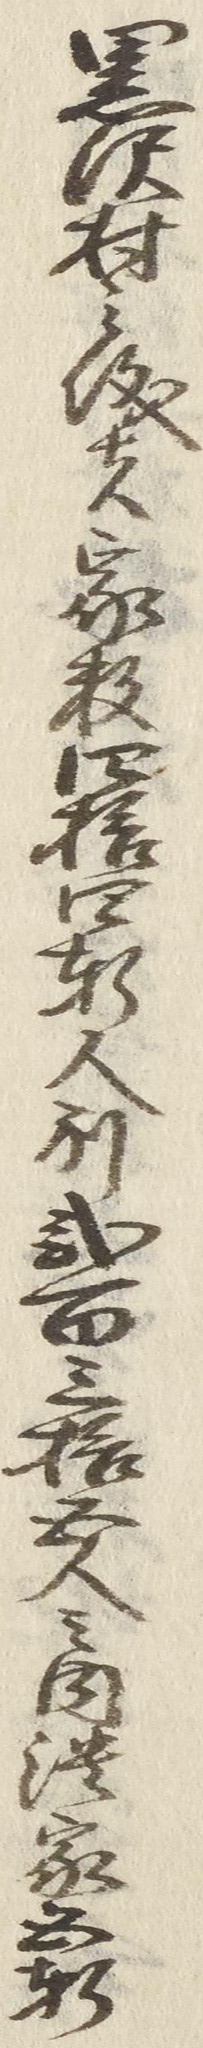も黒沢村之儀は家数四拾四軒人別弐百三拾五人之内潰家五軒
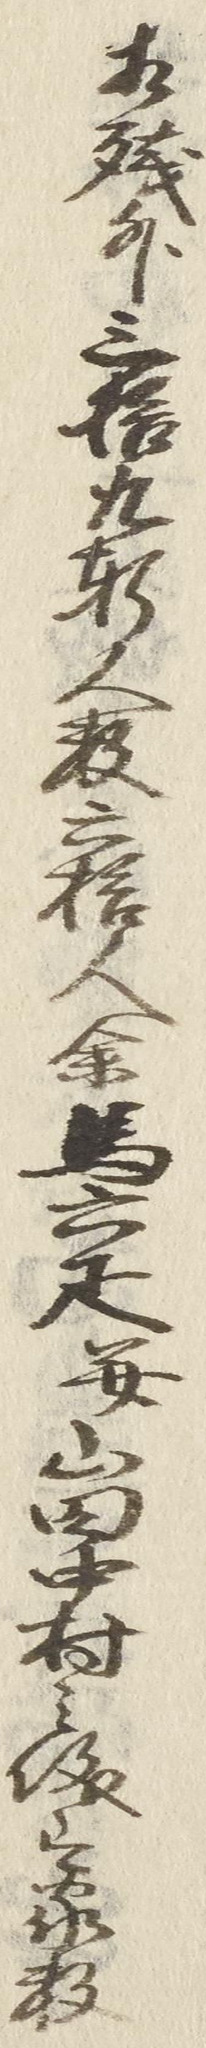相残外三拾九軒人別六拾人余馬六疋并山田中村之儀家数
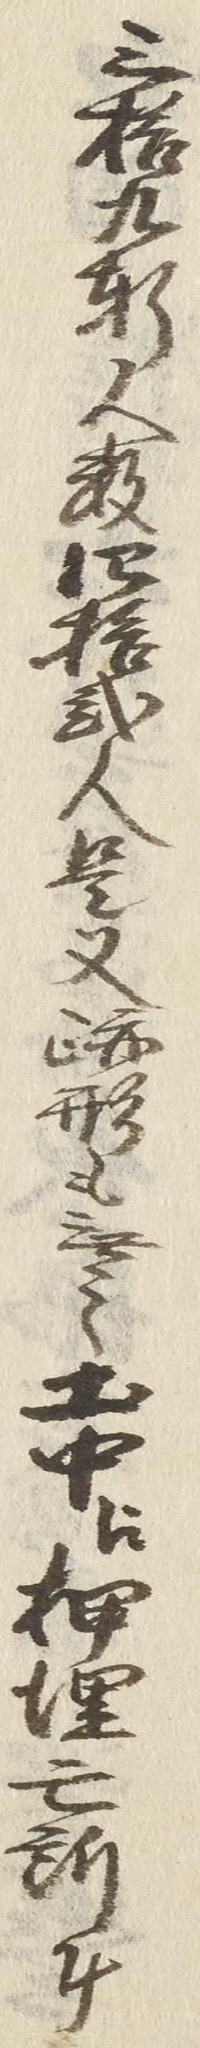三拾九軒人別四拾弐人是又跡形も無之土中江押埋亡所に
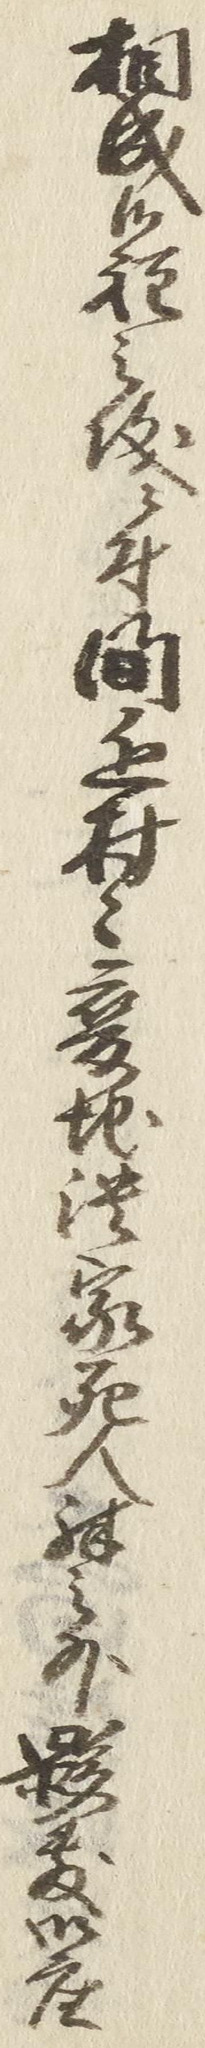相成候程之儀二付間近之村々変地潰家死人殊之外夥敷御座
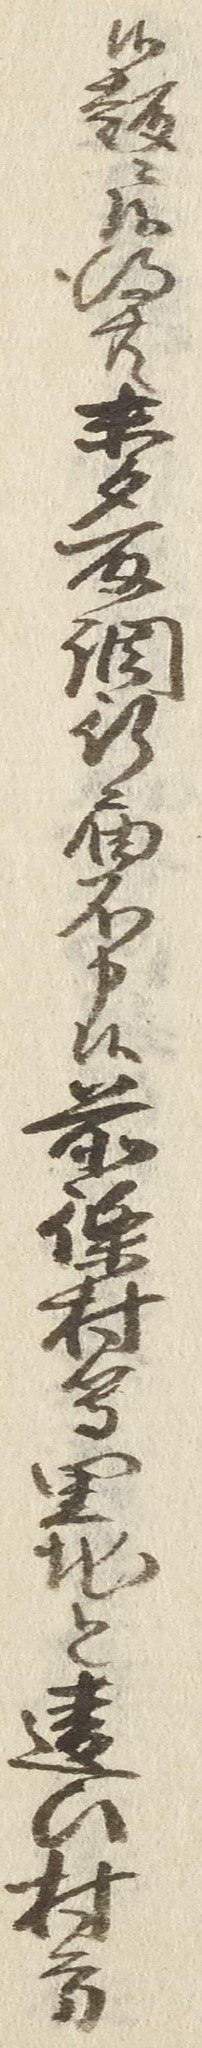候趣二候得共未タ取調行届不申候前條村等ハ里地と違ひ村方
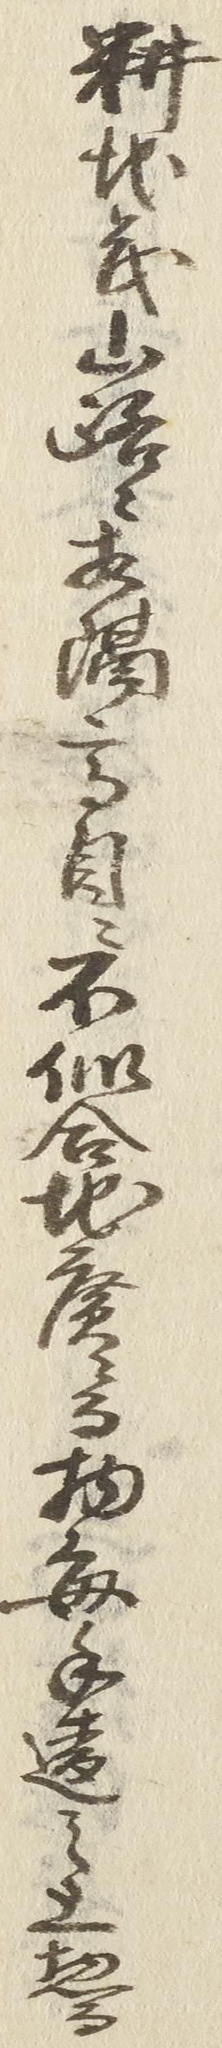耕地も山路二相隔高目二不似合地廣二而物事手遠之上惣而
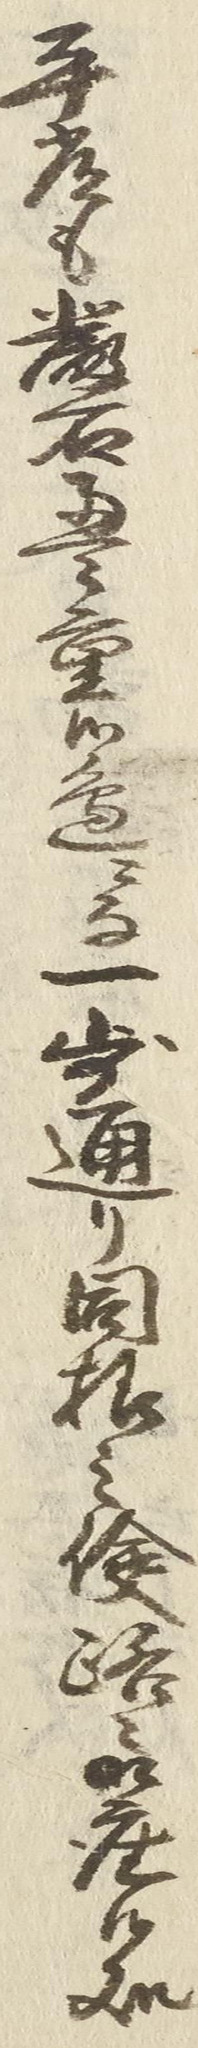平常も厳石畳重候辺二而一歩通同様之険路二御座候処
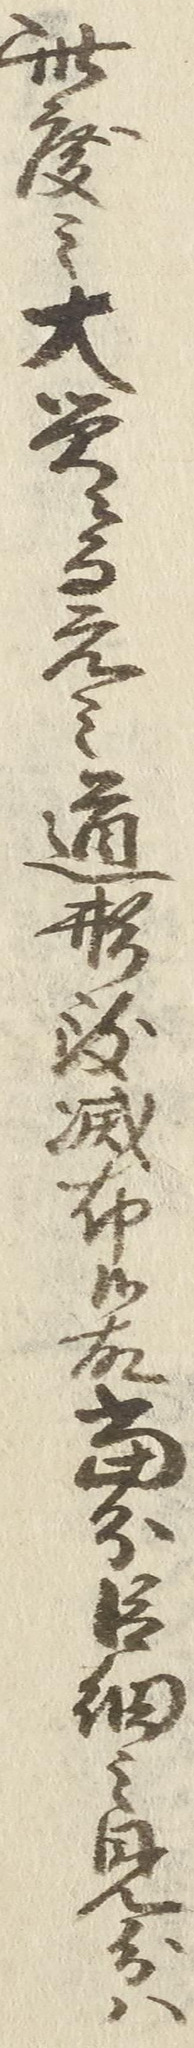此度之大災二而元之道形致滅却候故当分巨細之儀見分は
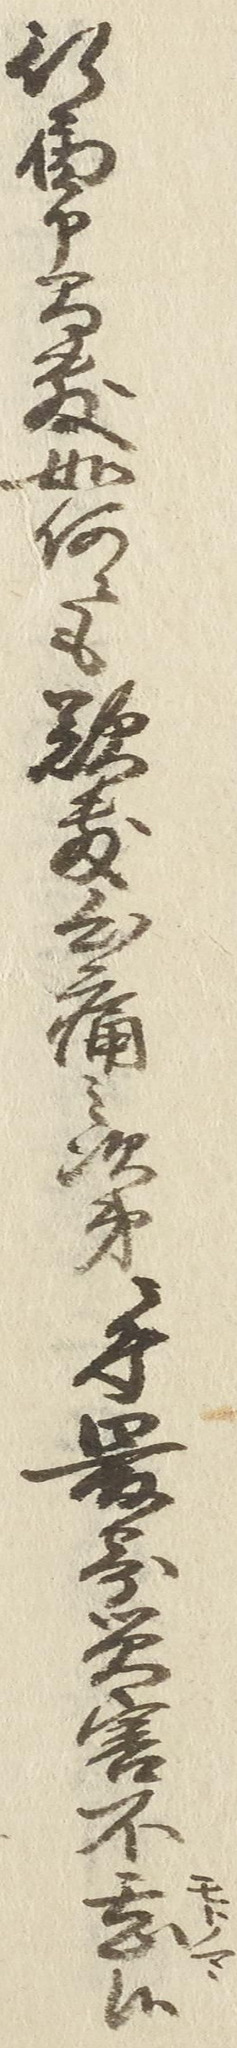行届申間敷如何二も歎敷心痛之次第二付最寄災害不甚候
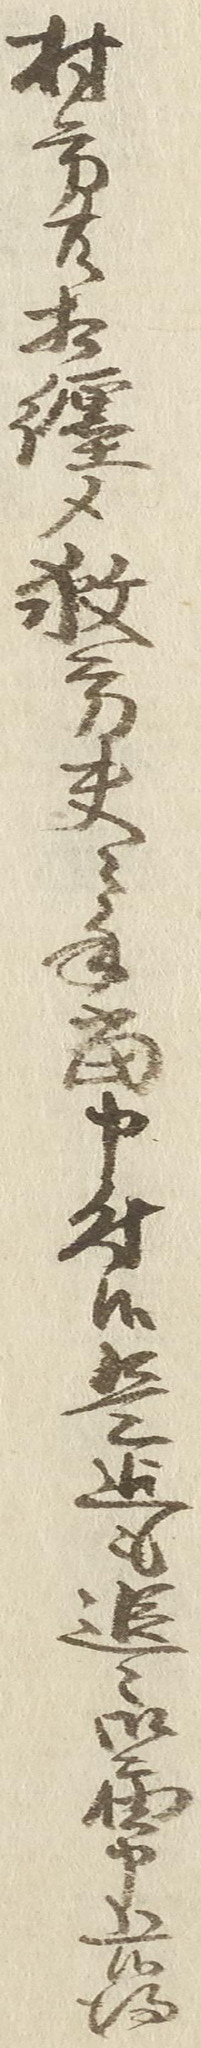村方共相纏メ救方夫々手当申付候是迄も追々御届申上候得
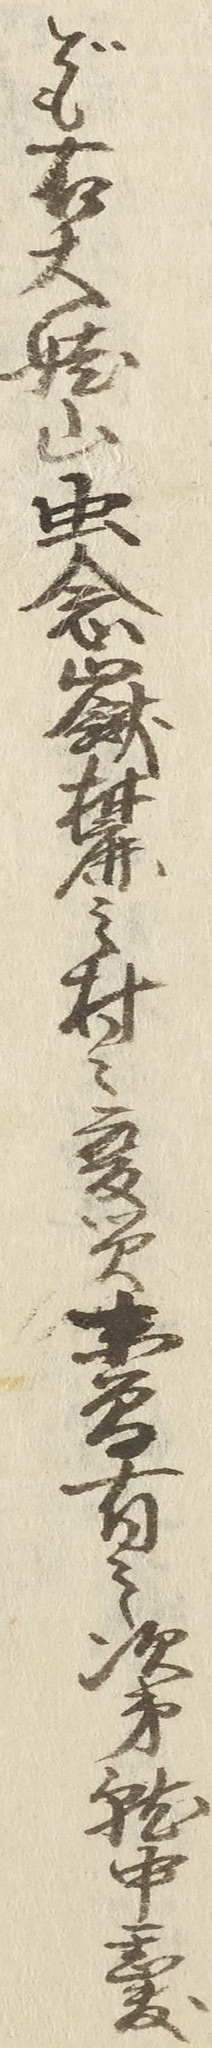ども右大姥山虫倉嶽麓之村々変災未曾有之次第就中甚敷
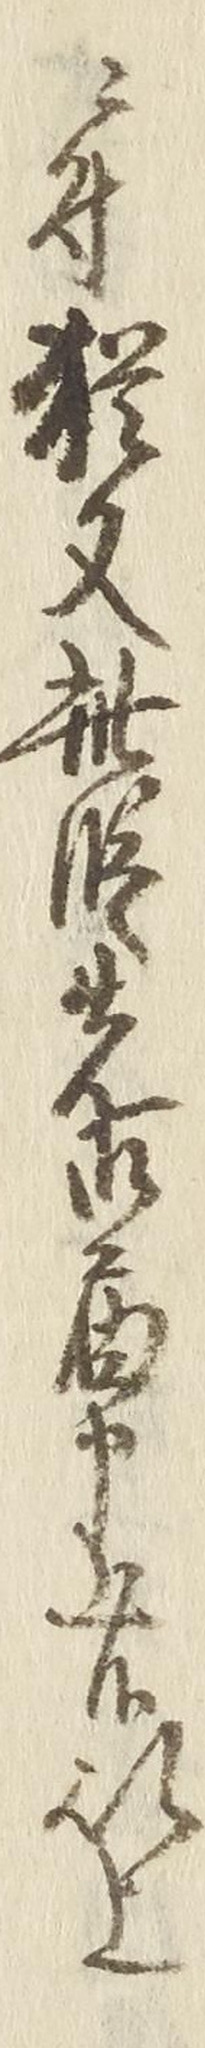二付猶又此段先御届申上候以上
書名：従往古地震御届書記誌之一
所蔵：東京大学地震研究所図書室 Earthquake Research Institute Library, The University of Tokyo, JAPAN
